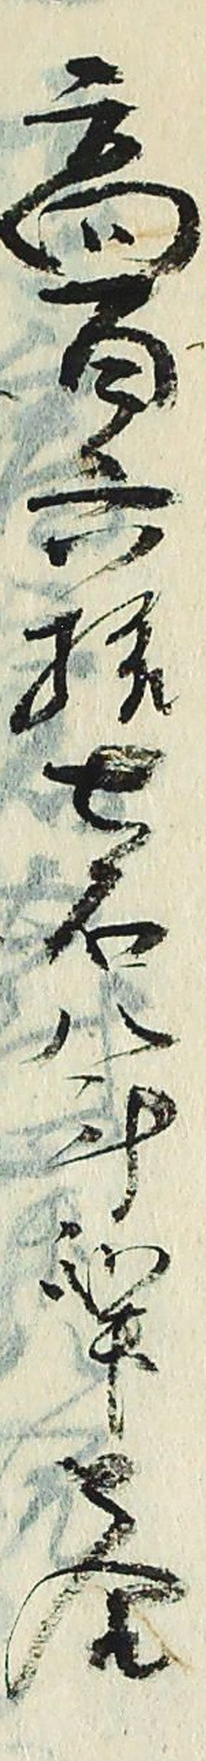高百六拾七石八斗弐升七合
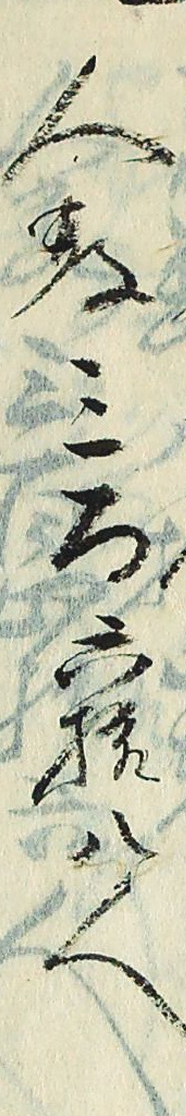人数三百六拾八人
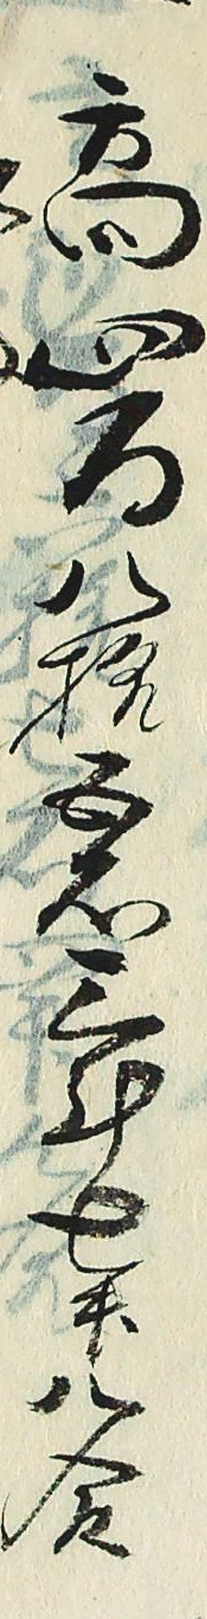高四百八拾五石三斗七升八合
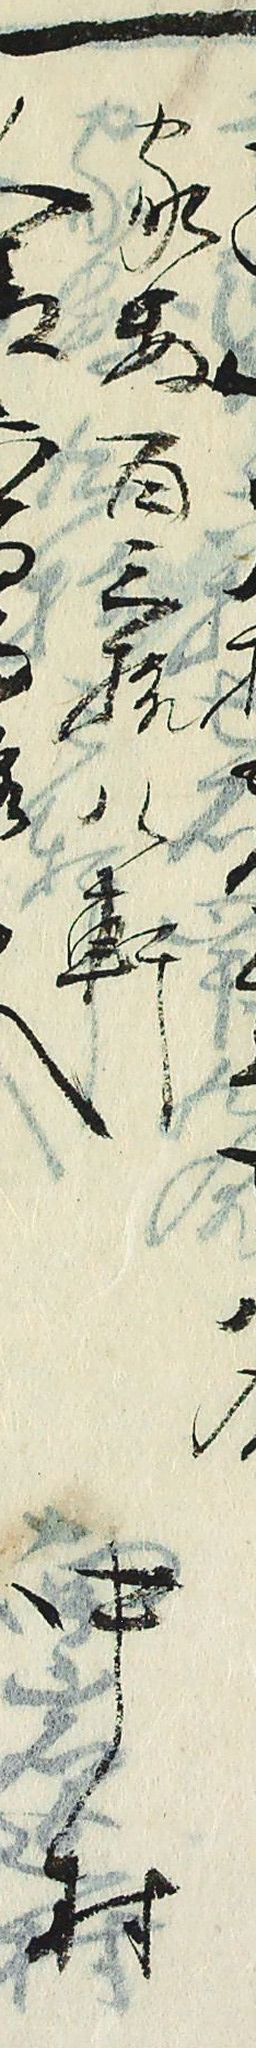家数百三拾八軒中村
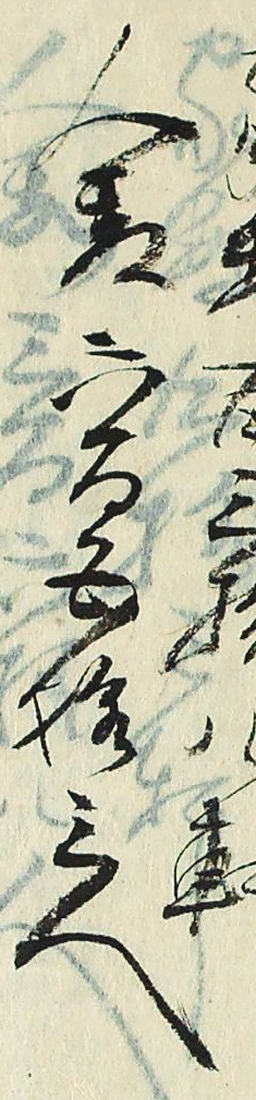人数六百五拾三人
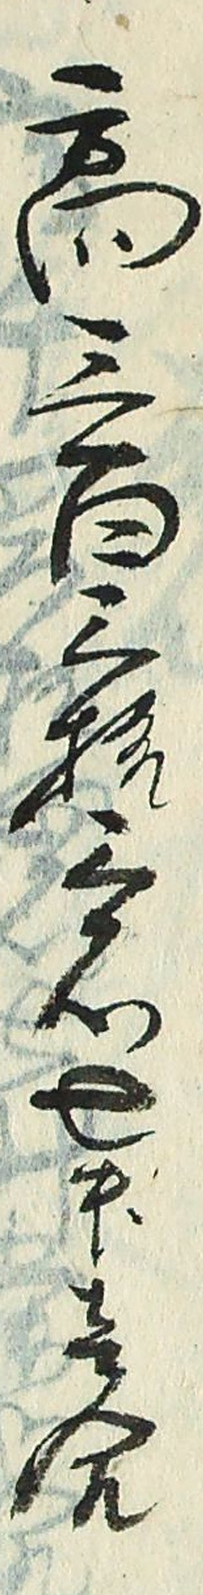高三百三拾三石七升壱合
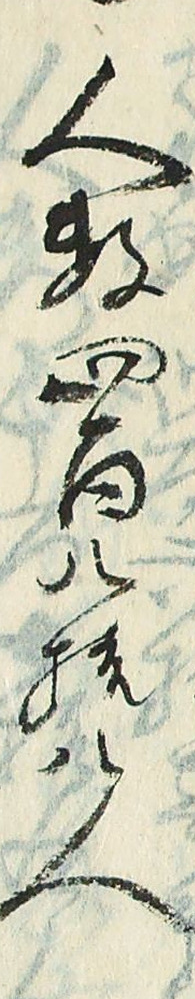人数四百八拾八人

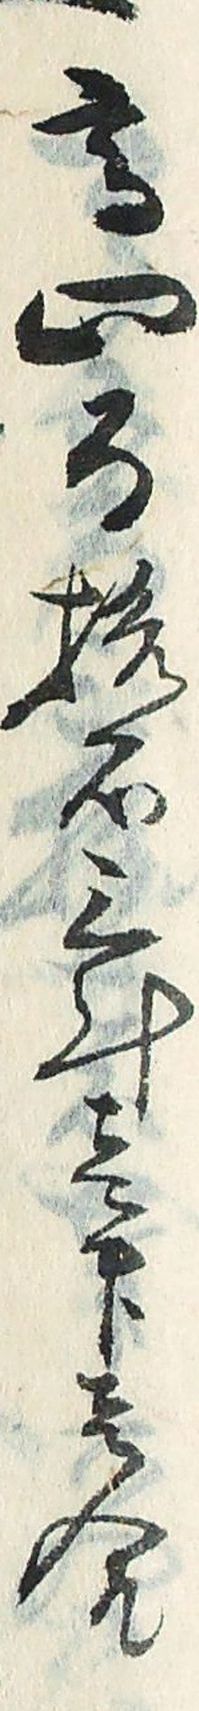高四百拾石三斗壱升壱合
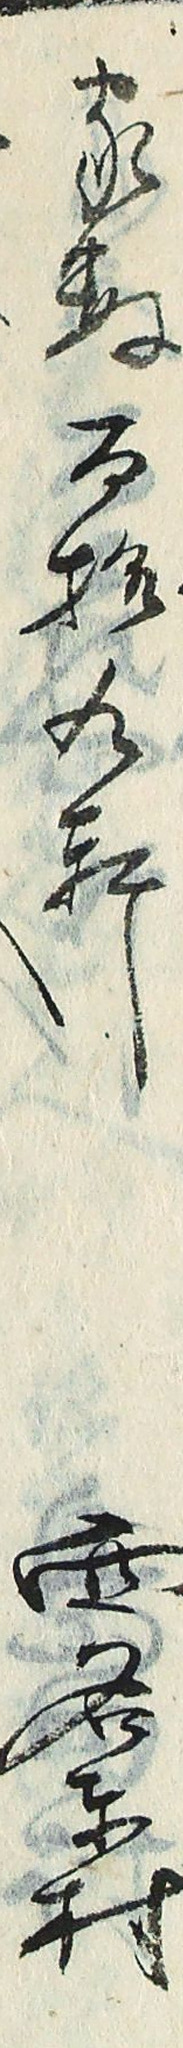家数百拾九軒西名東村
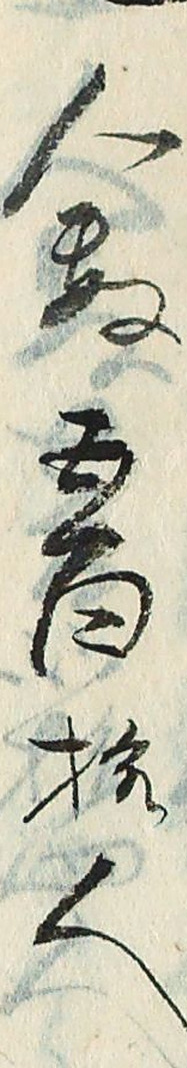人数五百拾人
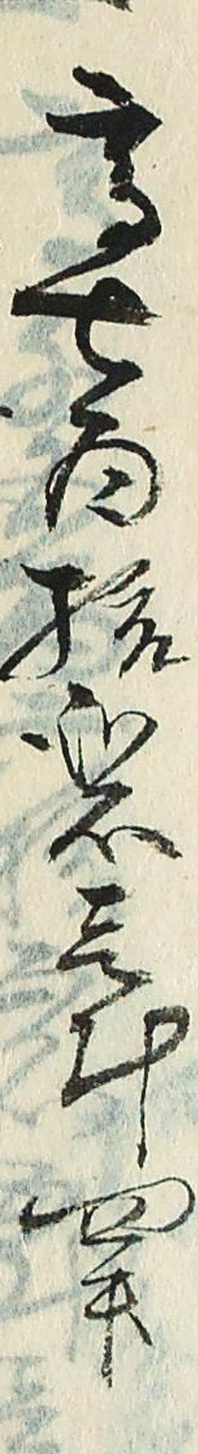高七百拾弐石三斗四升
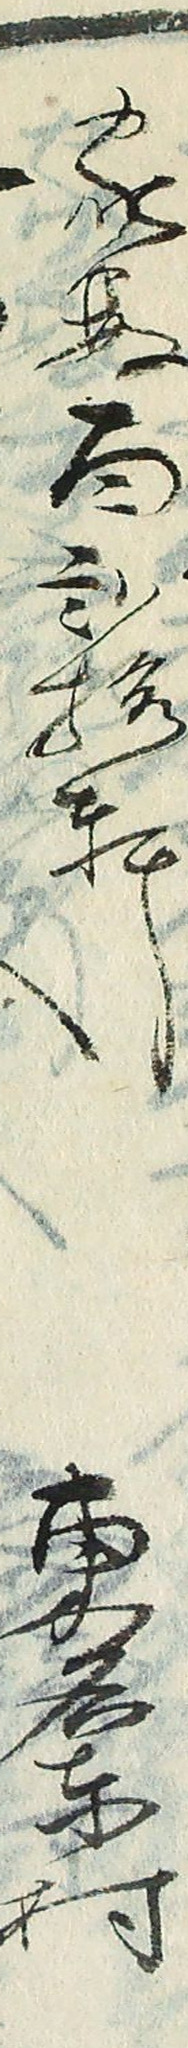家数百弐拾軒東名東村
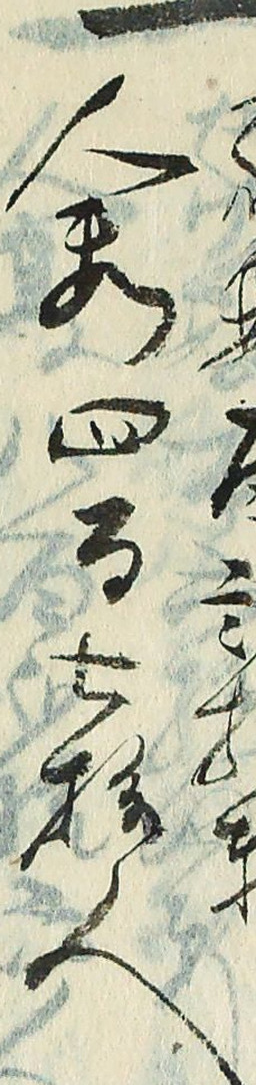人数四百七拾人
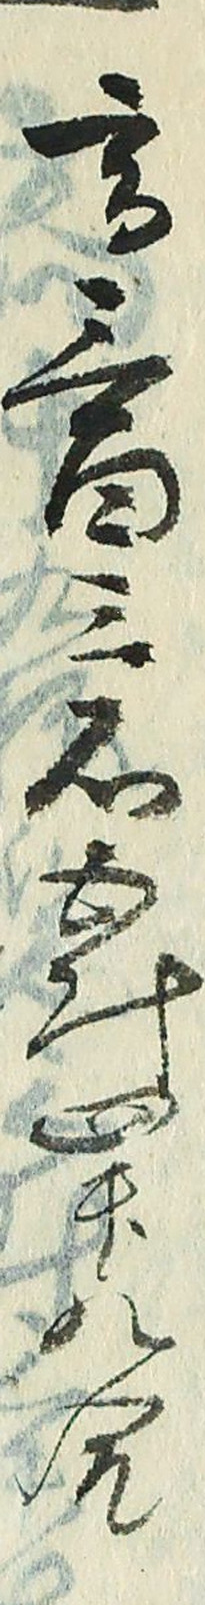高三百三石五斗四升八合
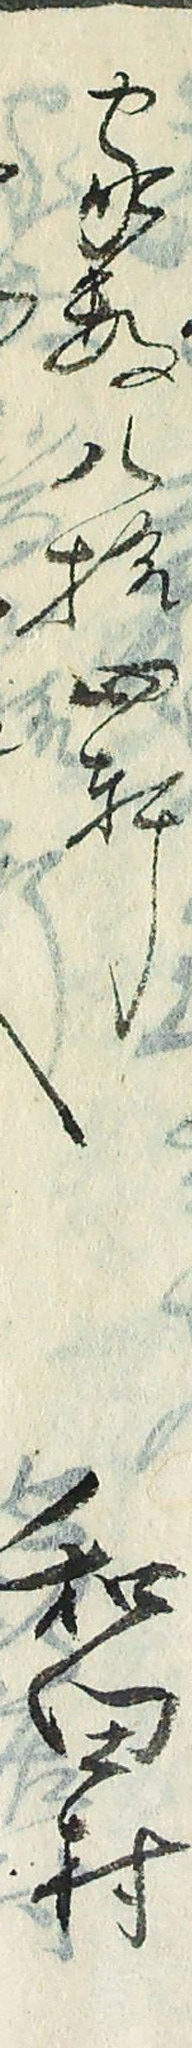家数八拾四軒和田村
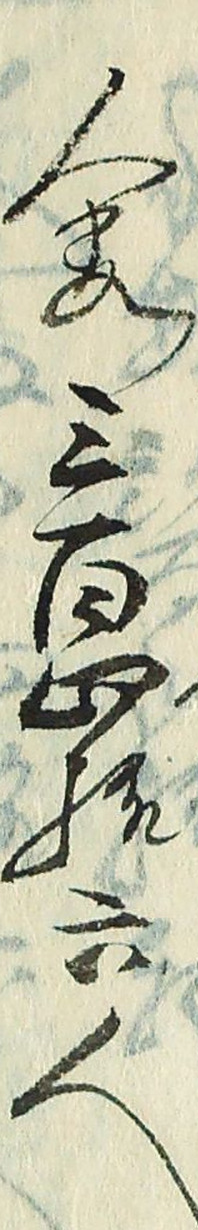人数三百四拾六人
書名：公辺御役人為御廻浦御立越諸御用一巻
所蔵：鳴門教育大学 Naruto University of Education
